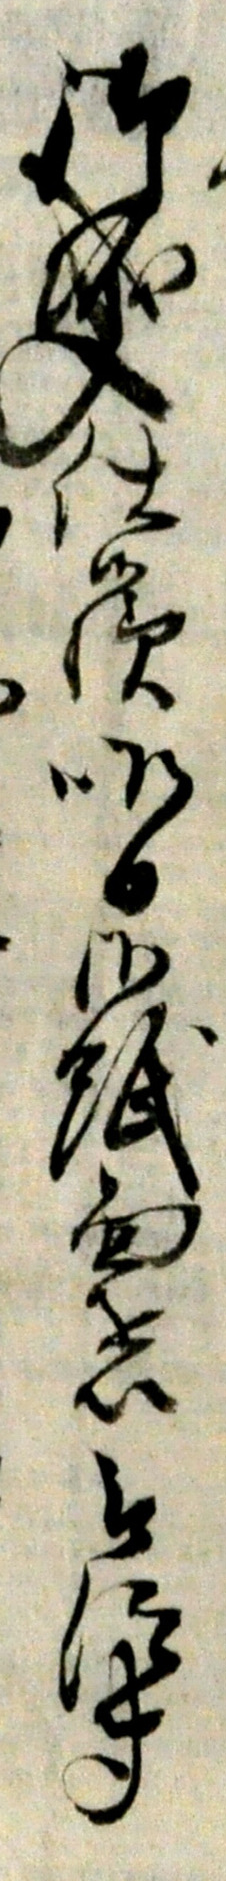御城入仕候様昨日御紙面を以被仰聞
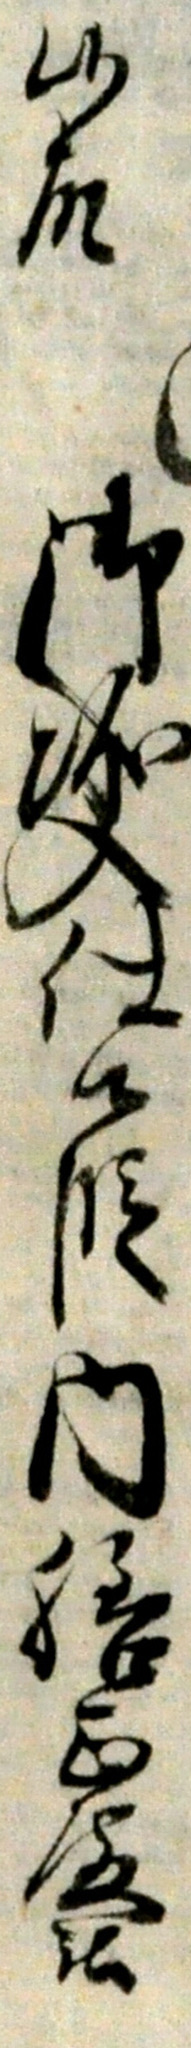候故御城入仕候段内膳正殿被
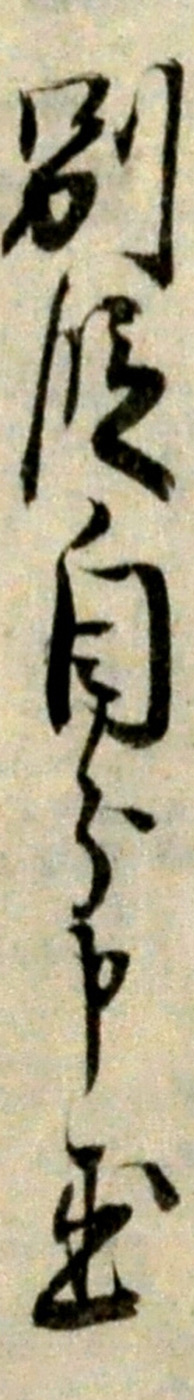別段自分申出
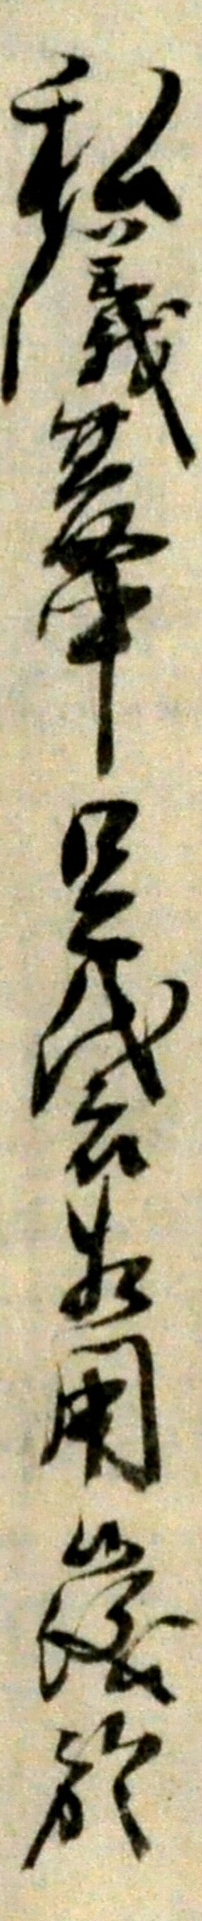私儀夏中足袋相用候儀於
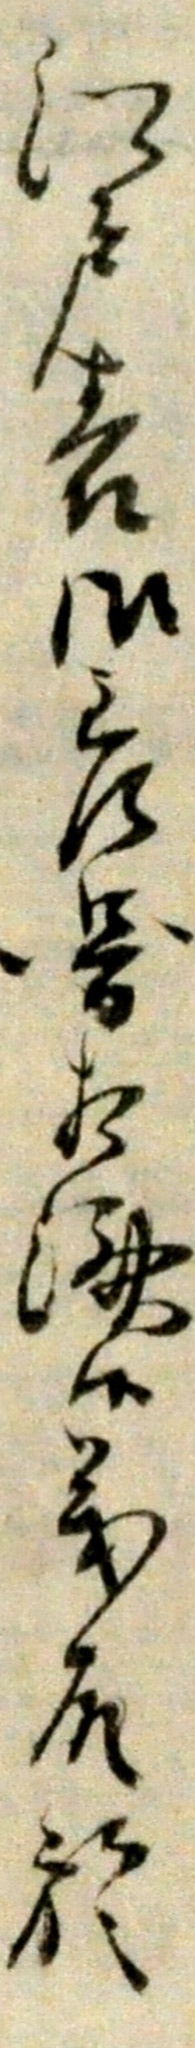江戸表御差図相済候義故於
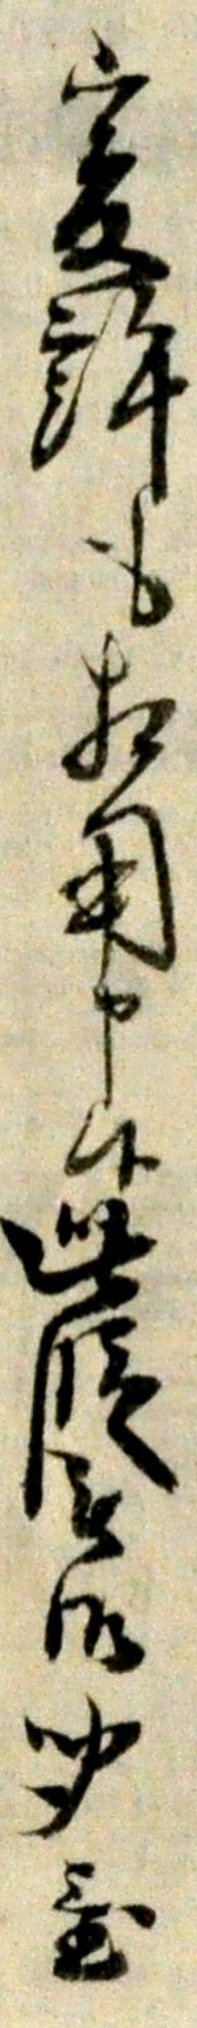爰許も相用申候此段被御聞置
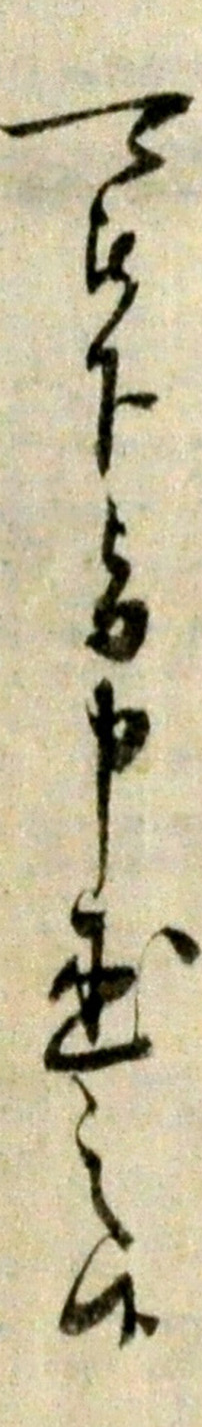可被下旨申述之候
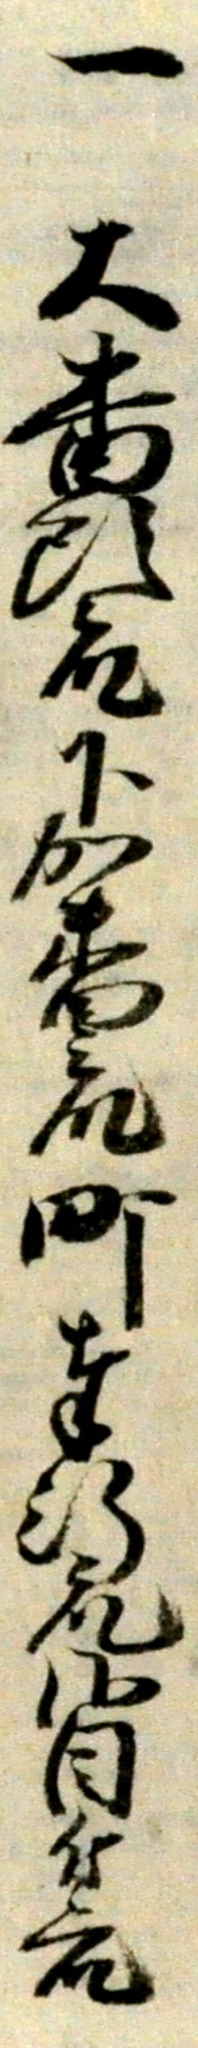一大番頭衆下加番衆町奉行衆御目付衆
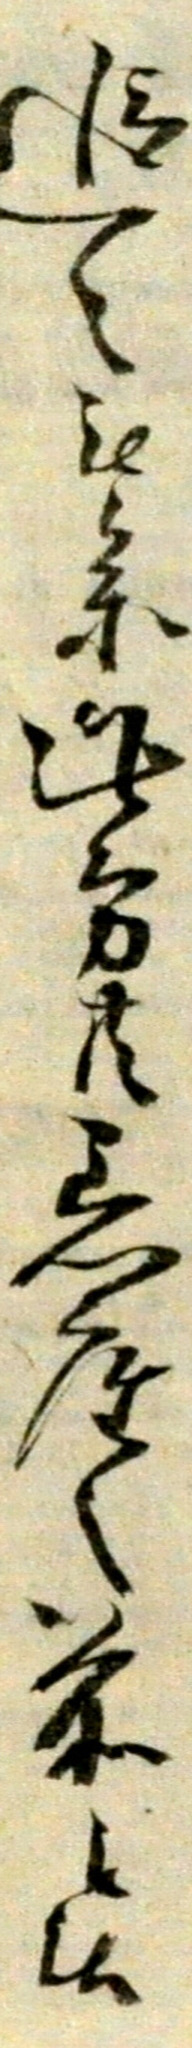追々被参此方共着座之前江被
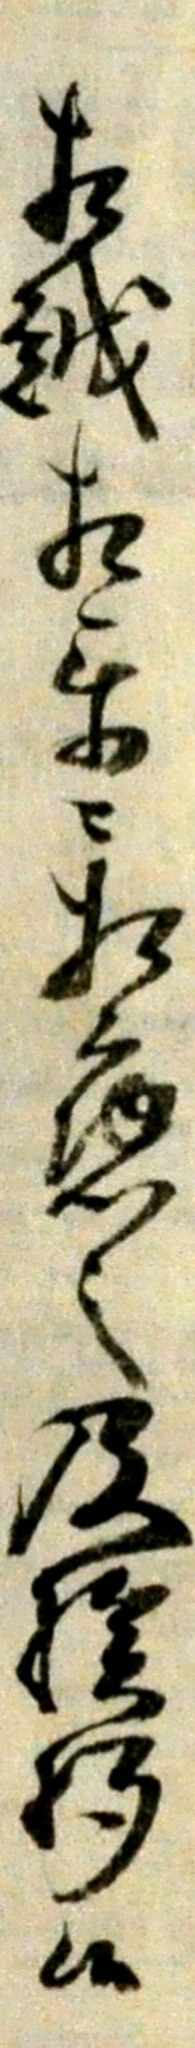相越相来ニ相応之及挨拶候
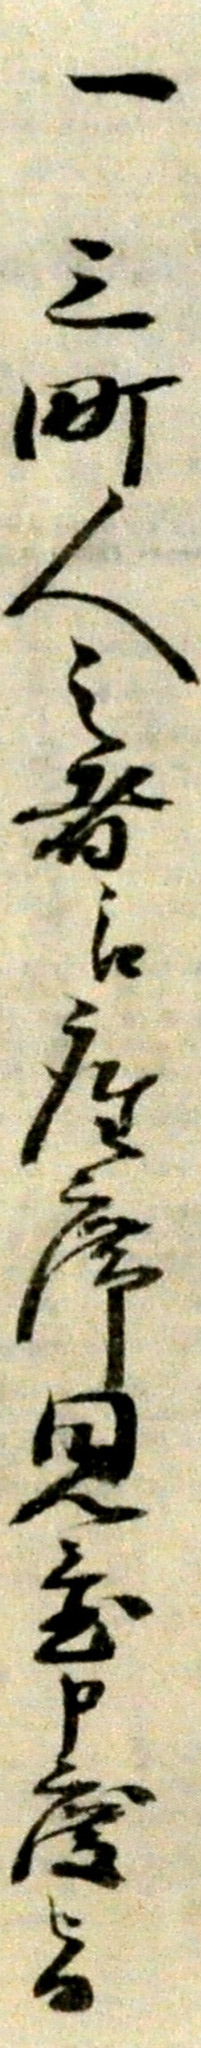一三町人之者江座席見置度旨
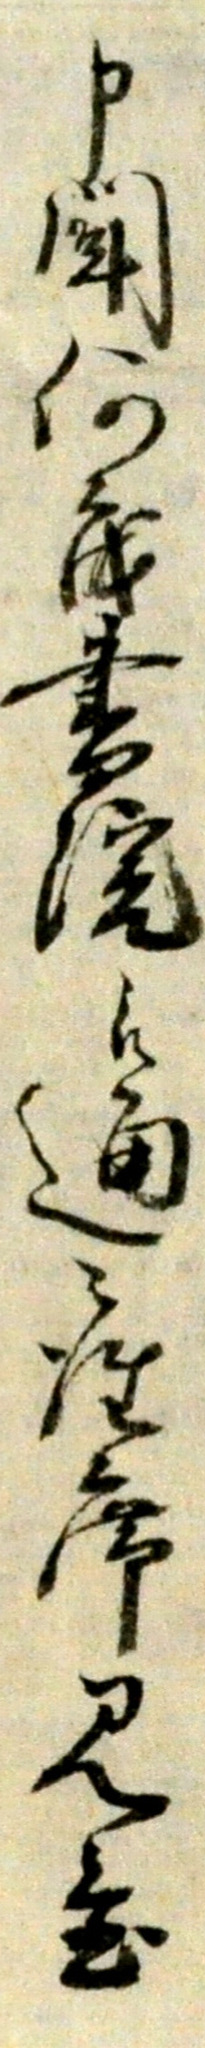申聞何茂書院江通座席見置
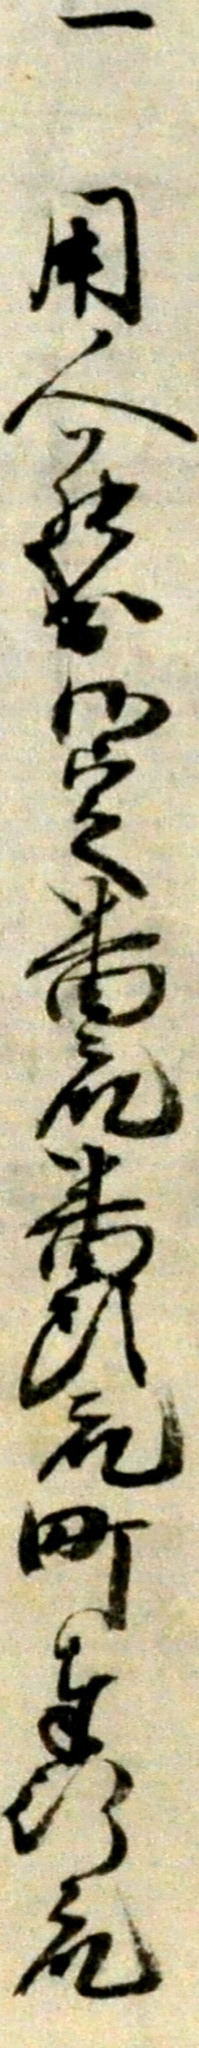一用人罷出御定番衆番頭衆町奉行衆
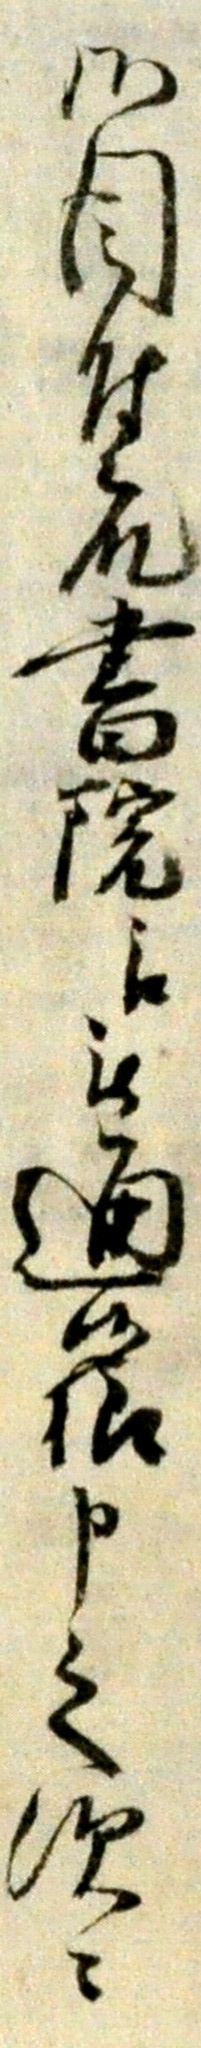御目付衆書院江被通候様申之次々
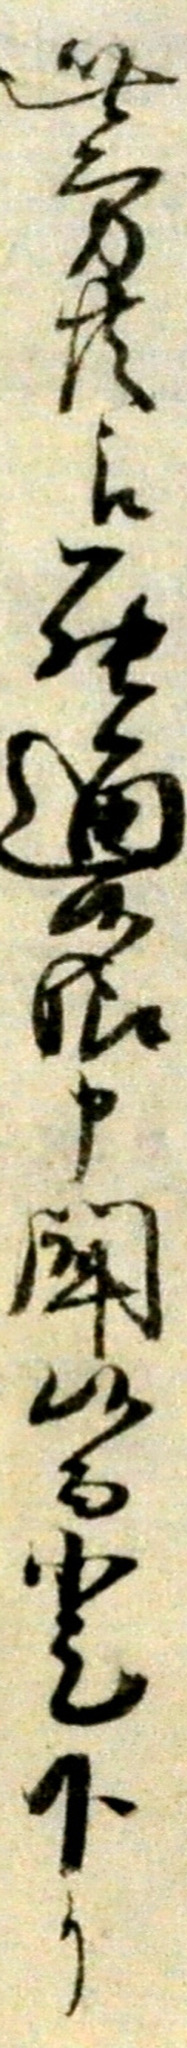此方共江罷通候様申聞候而登下り
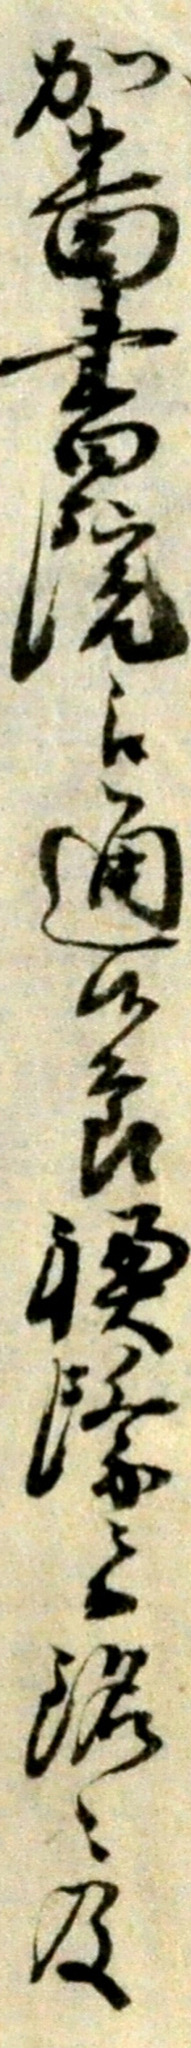加番書院江通り候節襖際二而銘々及
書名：大阪加番関係諸書留〔一括〕
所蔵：伊那市立高遠町図書館・合同会社AMANE
